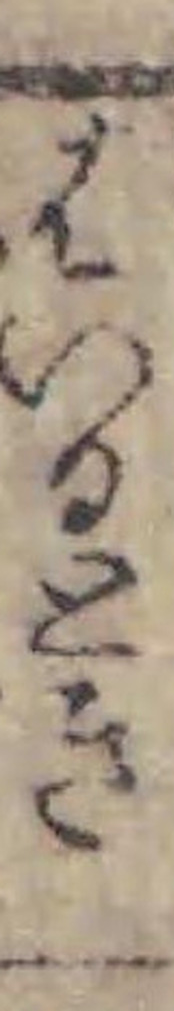はいるとき
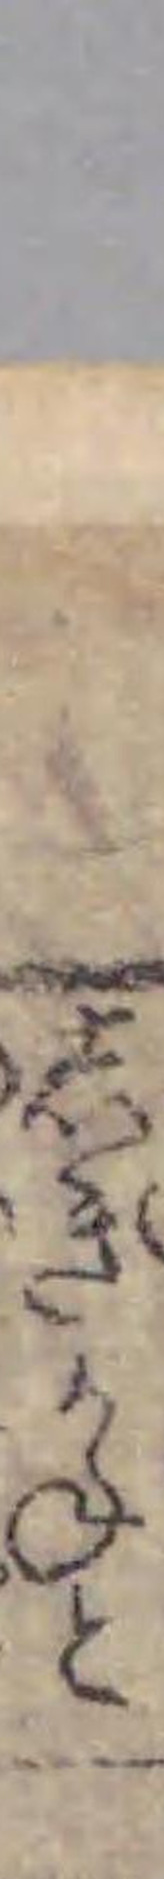しきかねと
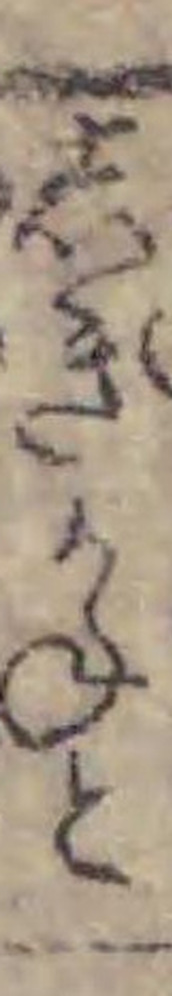しきかねと
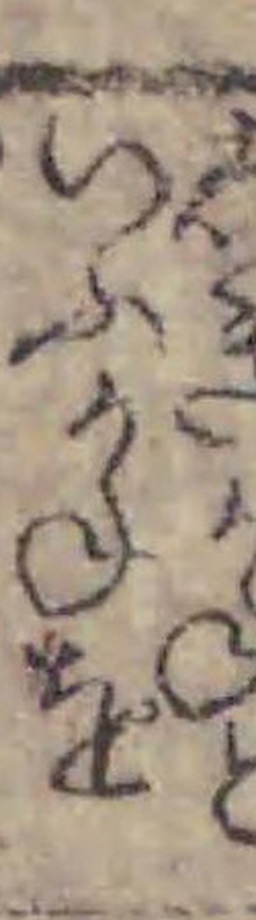いふかねを
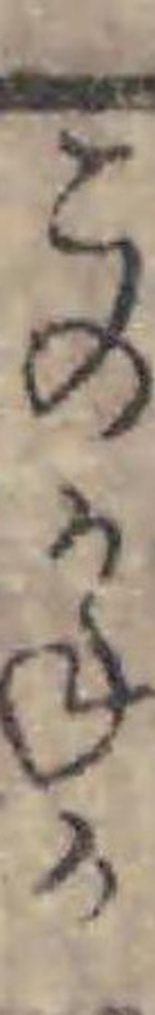このかねか
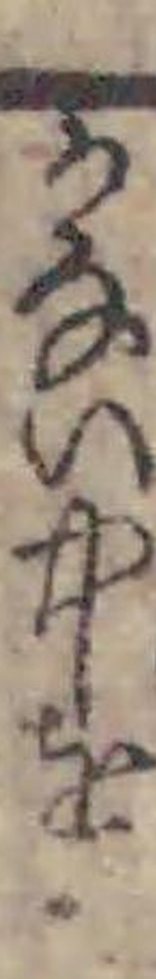かない中を
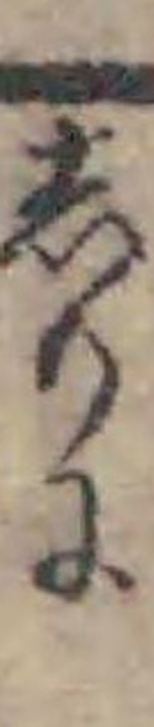しりに
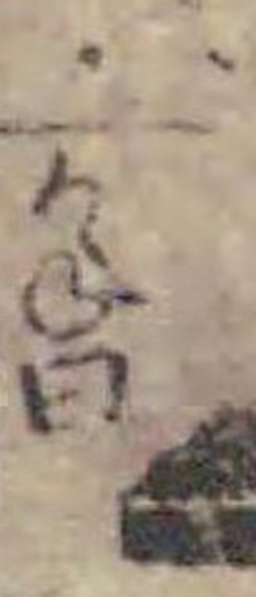かね曰
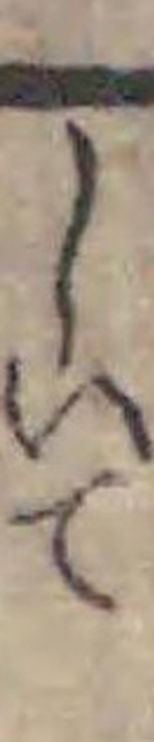しいて
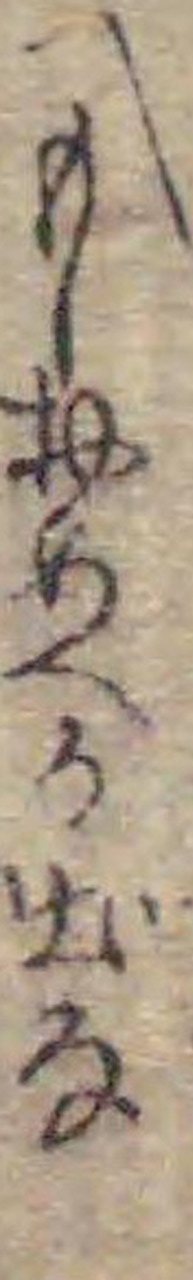〽もしおめへか出な
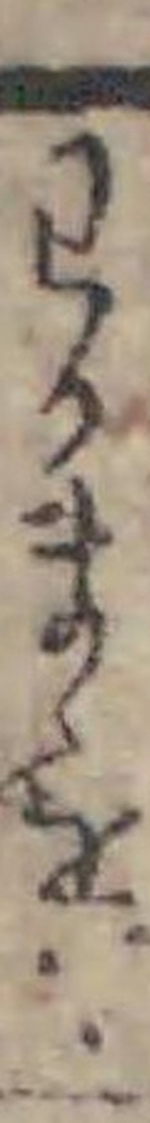わかまゝを
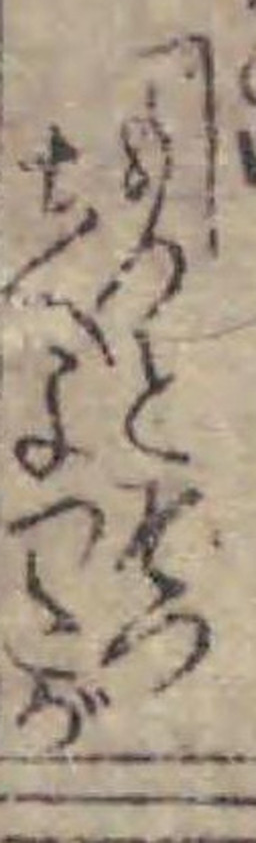ちへよつたが
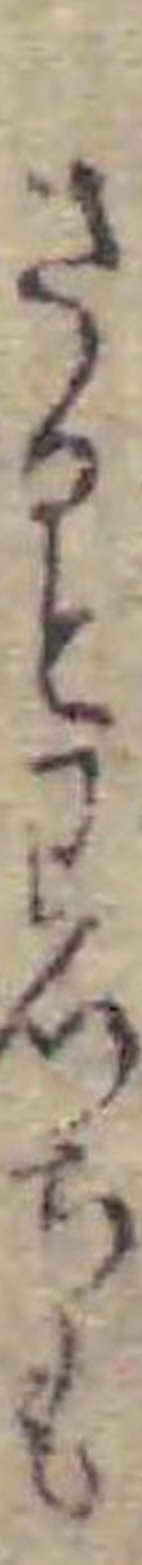さるとわつちも
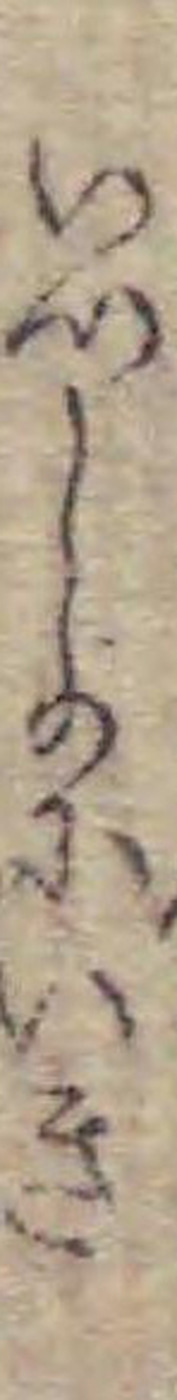いつしよにいき
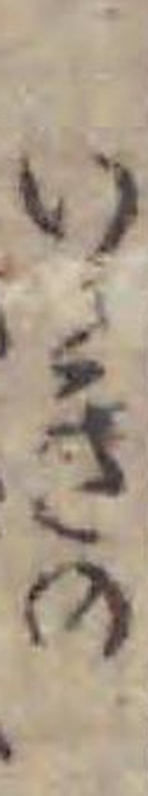いゝきの
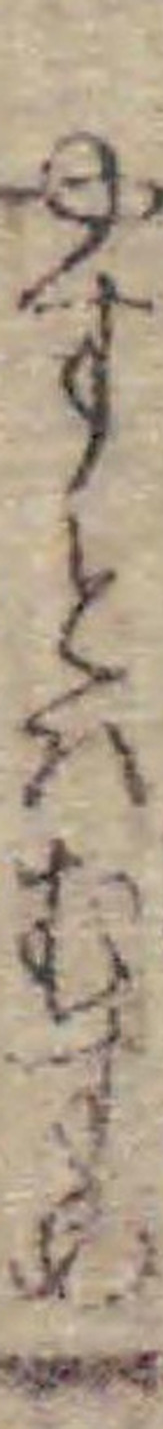やすとはむすめ
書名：新鋳小判 : 3巻
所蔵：国立国会図書館 National Diet Library, JAPAN
